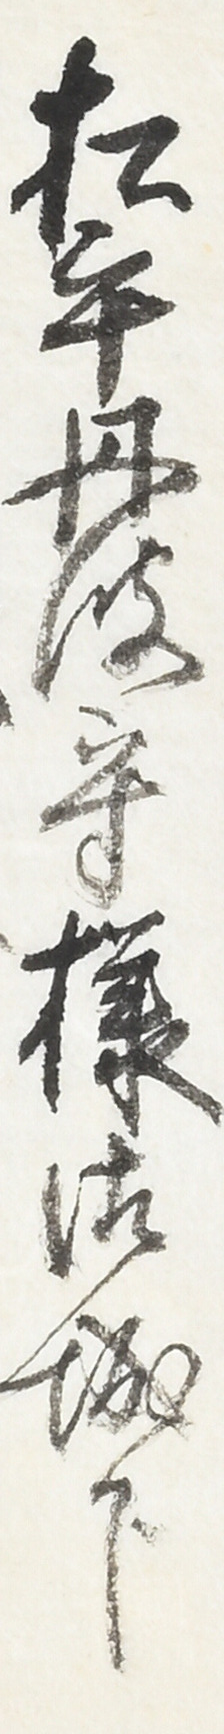松平丹波守様御城下
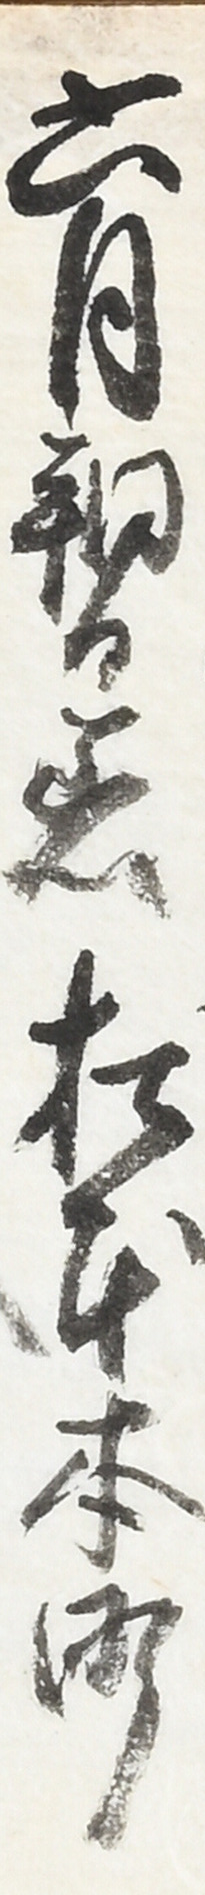六月朔日着松本本町
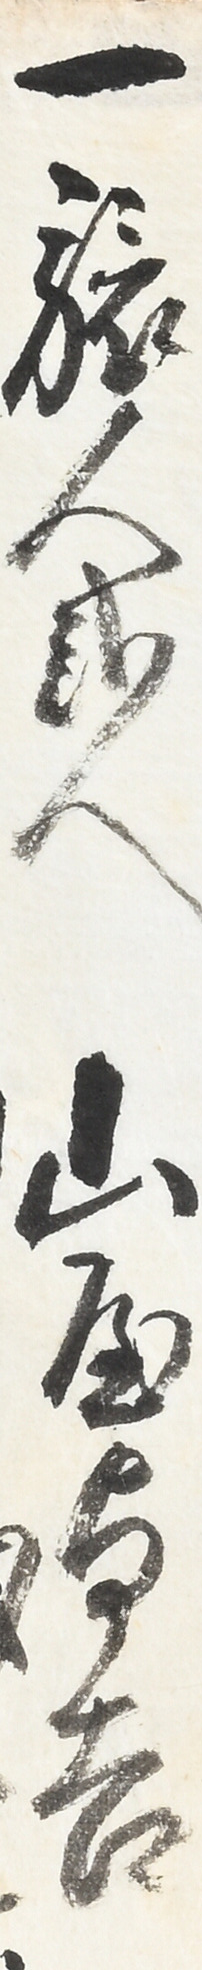一旅人弐人山屋与吉

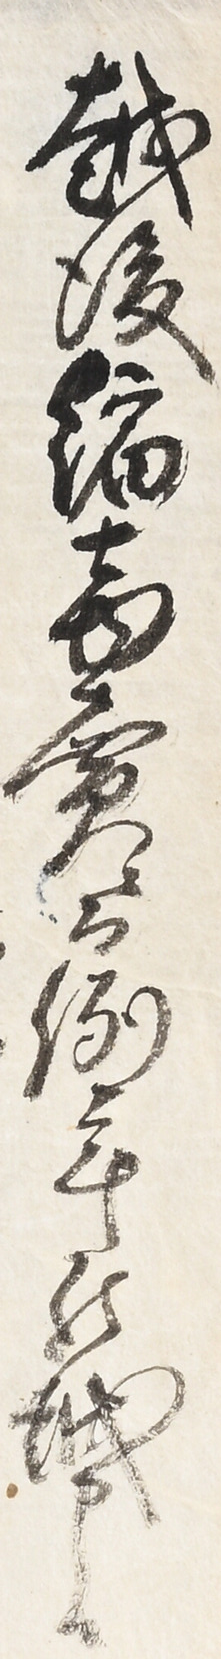越後縮商売ニ而例年罷越申候
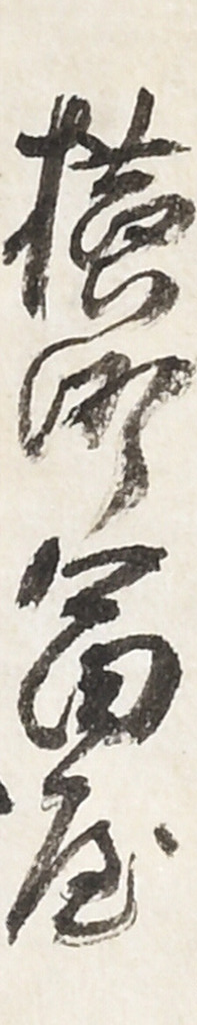横町冨屋
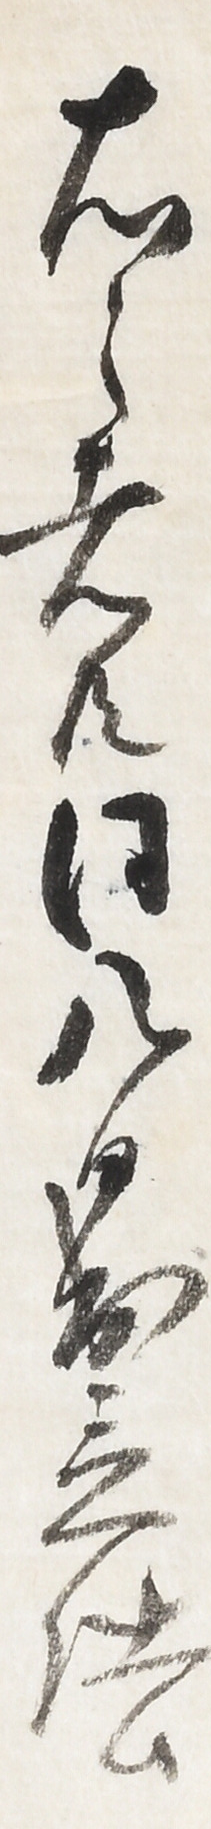右之者共同八日出立仕候
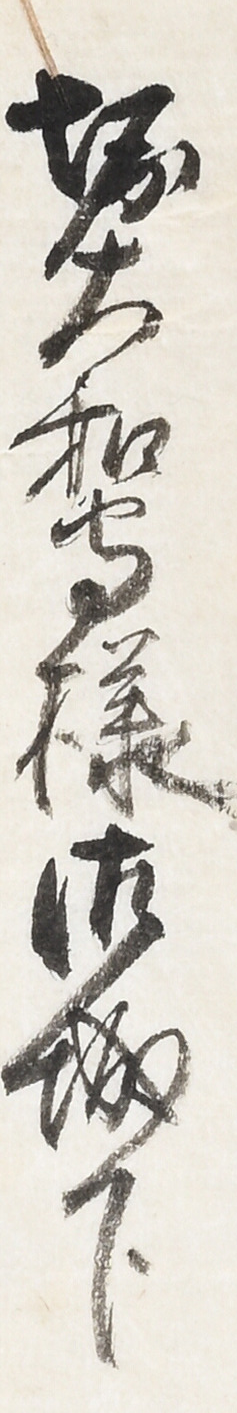堀大和守様御城下
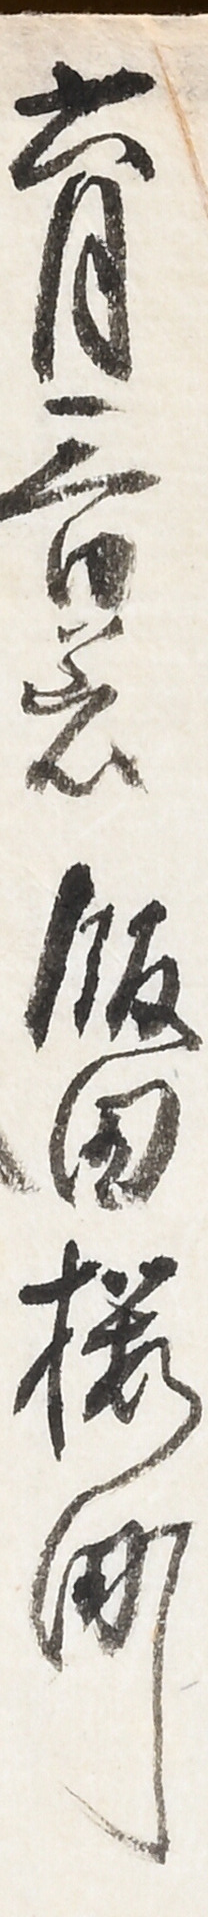六月三日着飯田桜町
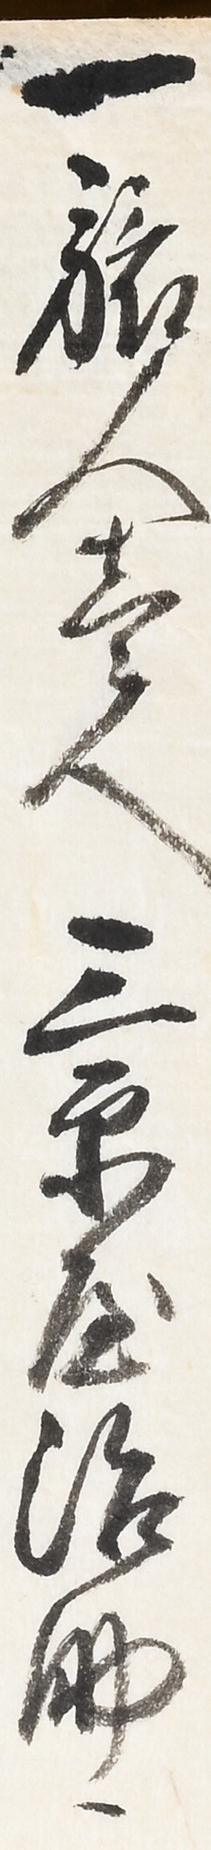一旅人壱人三原屋治助・
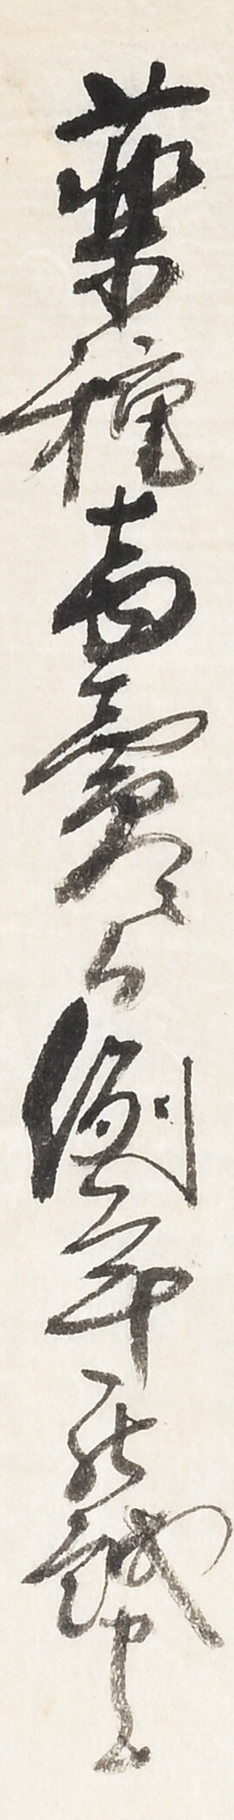薬種商売ニ而例年罷越申候
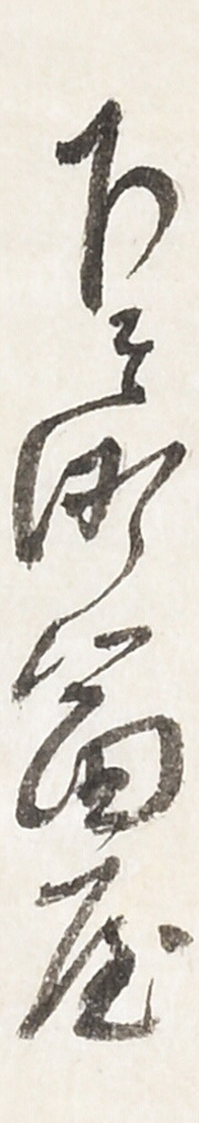下モ町冨屋
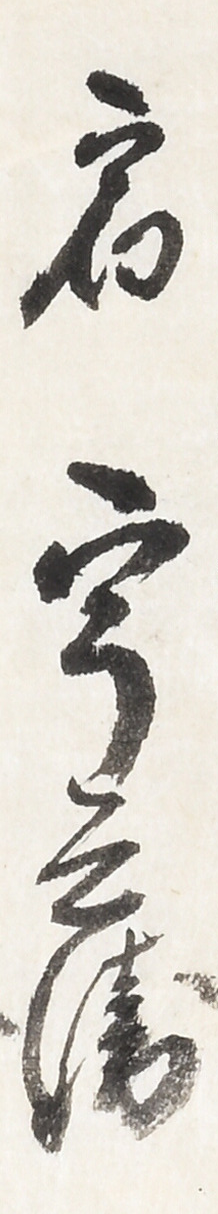宿宇兵衛
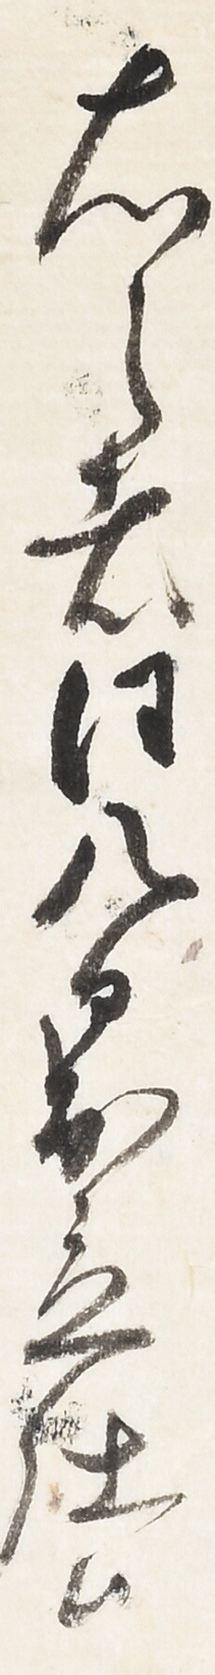右之者同八日出立仕候
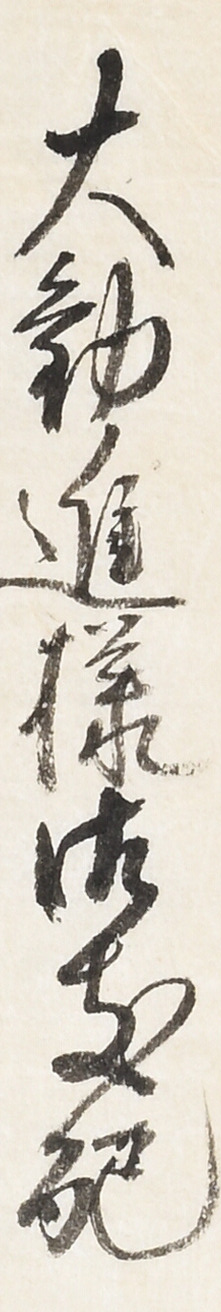大勧進様御支配
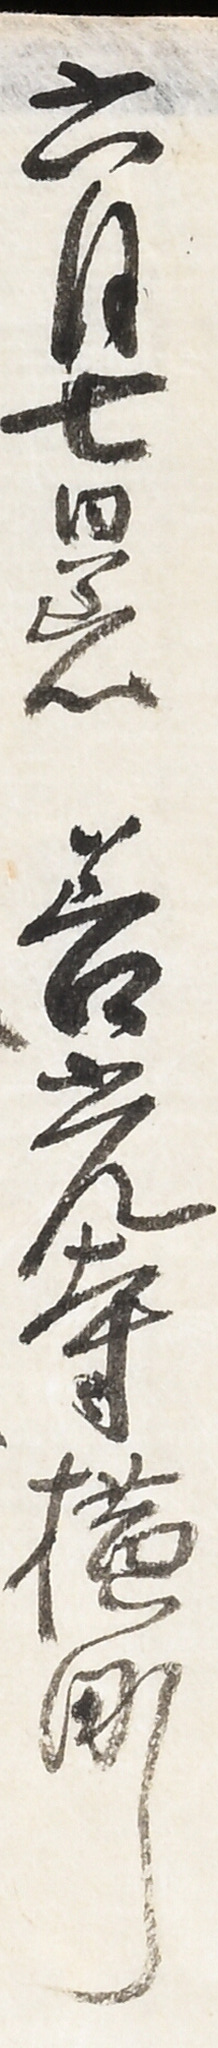六月七日着善光寺横町
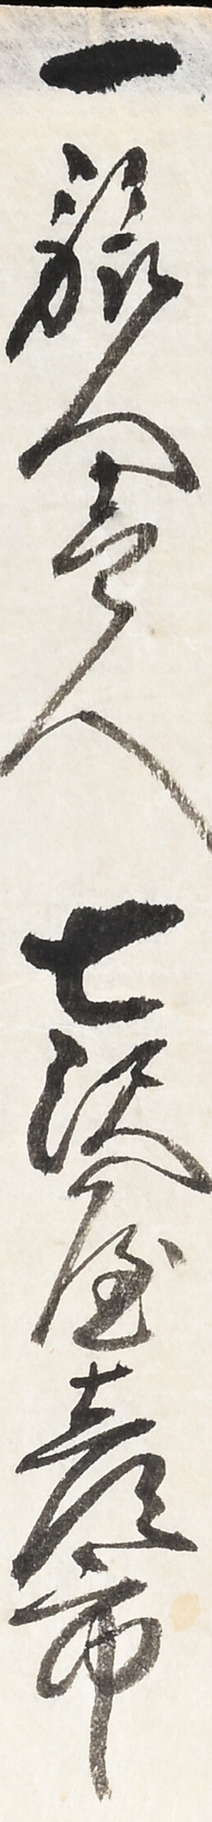一旅人壱人七沢屋彦市
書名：旅人泊控帳
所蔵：伊那市立高遠町図書館・合同会社AMANE
